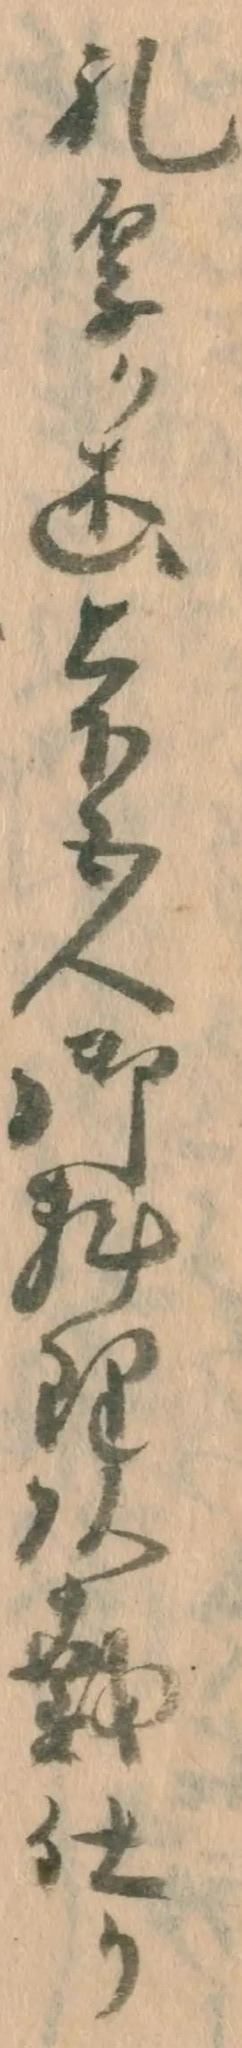礼厚ク述上下五人御料理頂戴仕り
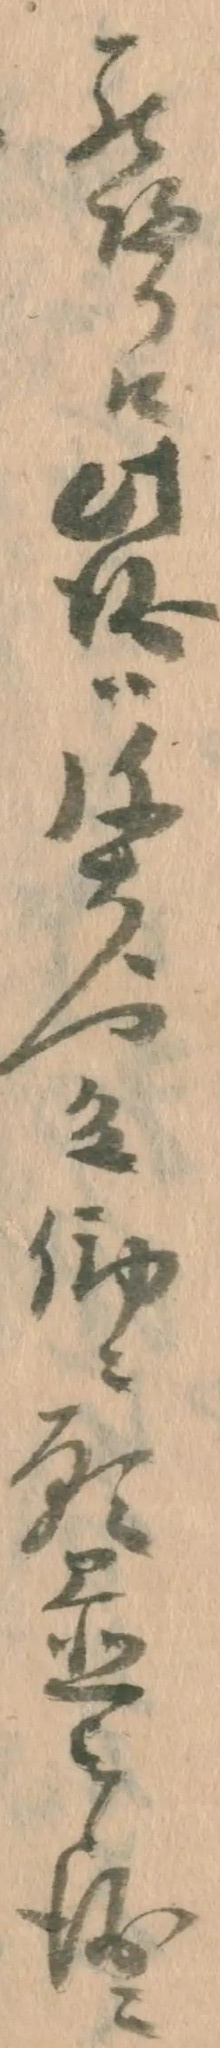罷帰り候此儀ハ弥右衛門殿働ニ願置与候儀ニ
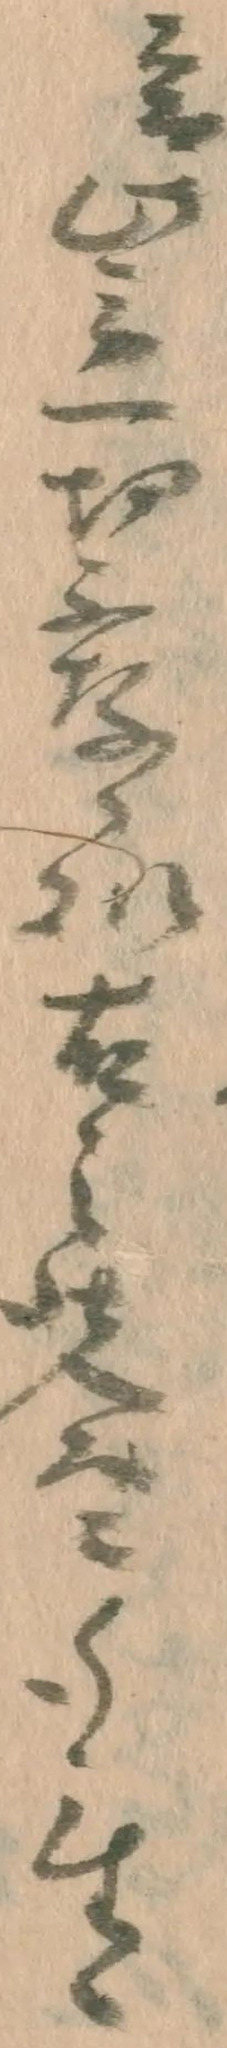ニ而此方一切不存候処右之仕合ニ御座候
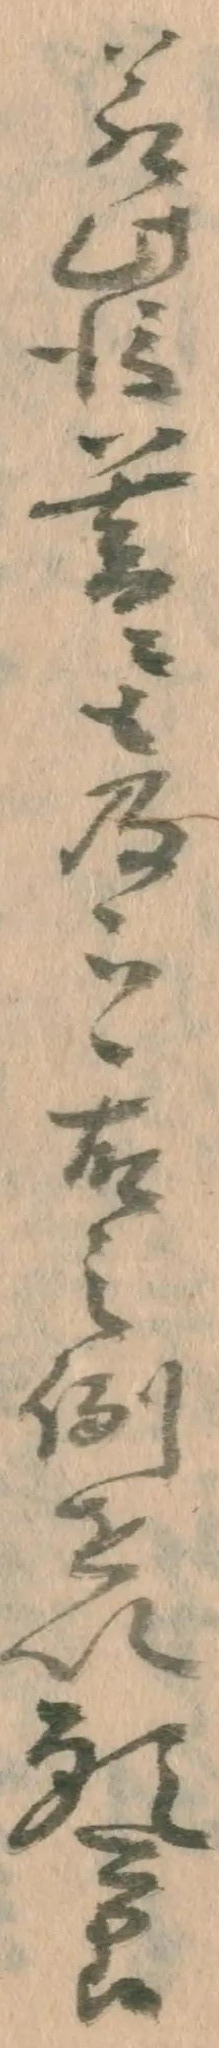若此後暮ニも及候ハヽ右之例を以願可申候
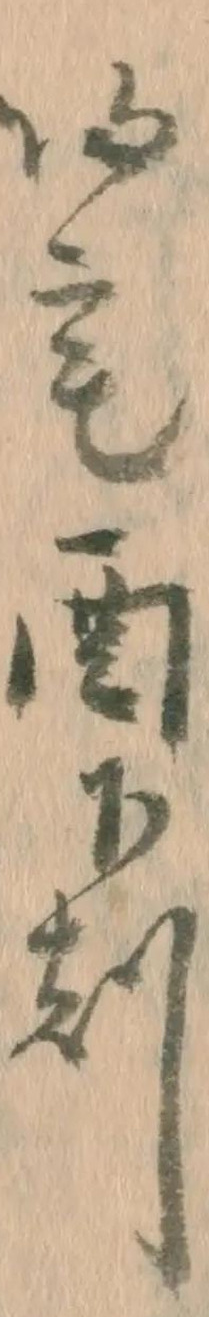帰宅酉下刻
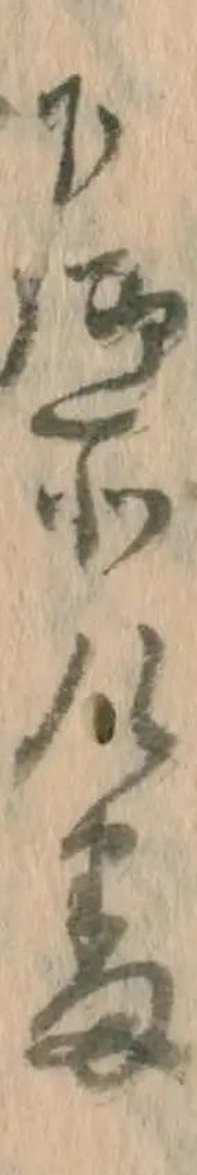下御所八番
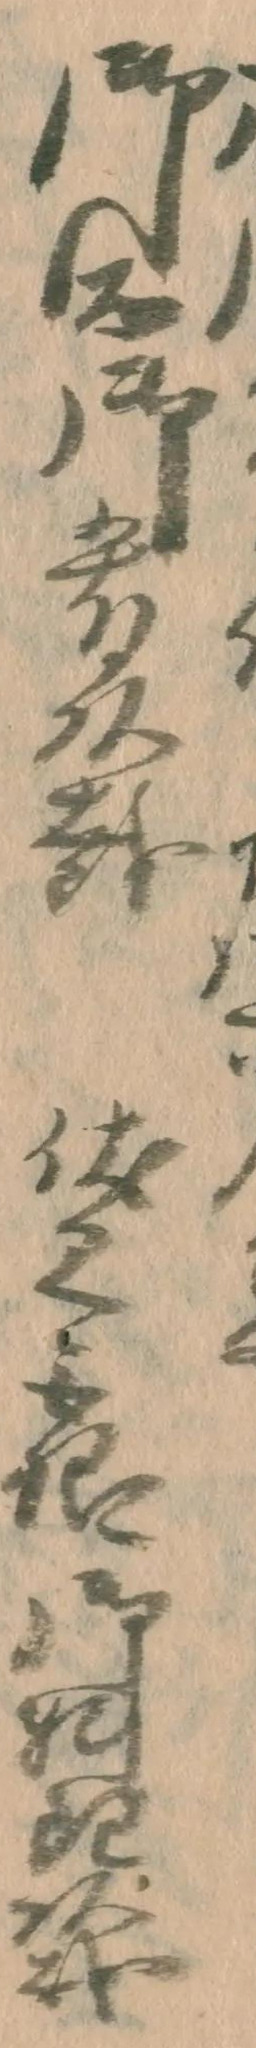御酒御肴頂戴伏見宮様御料理頂戴
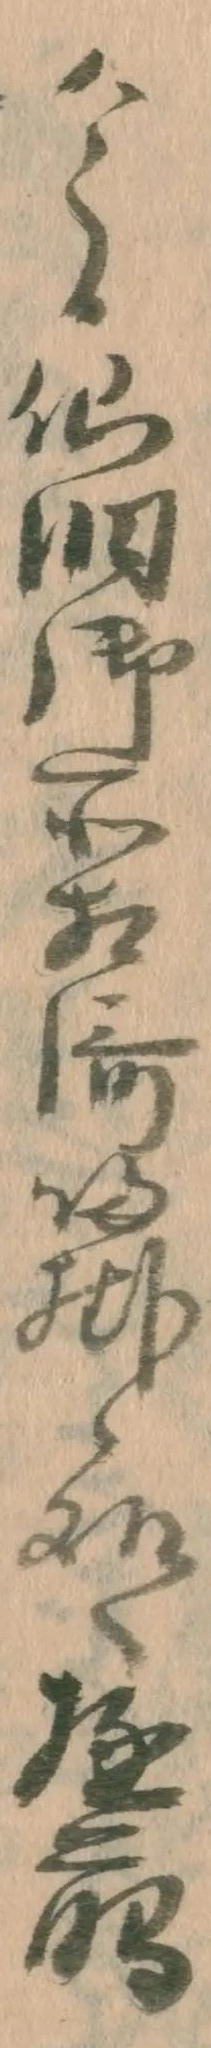今日仙洞御所相済帰掛候処へ極臈
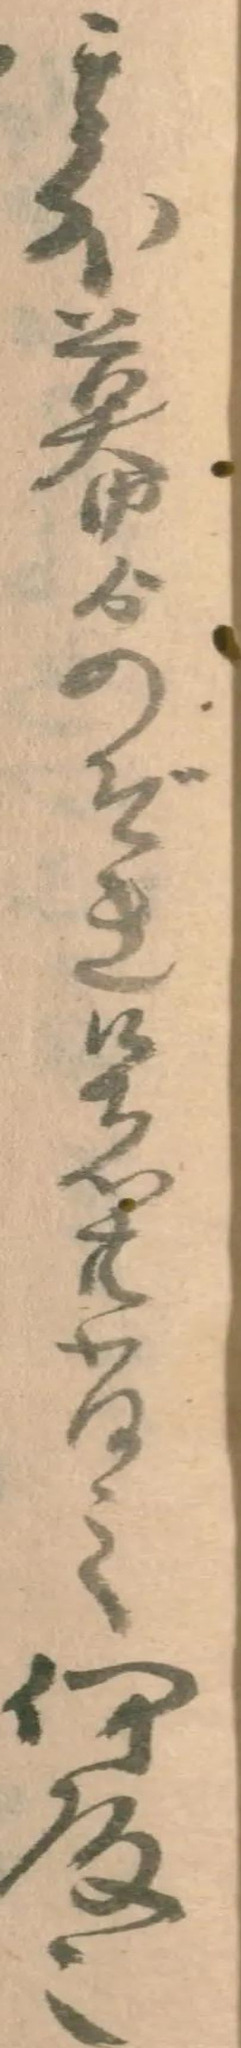其外幕ゟのぞき候者共有之何殿之
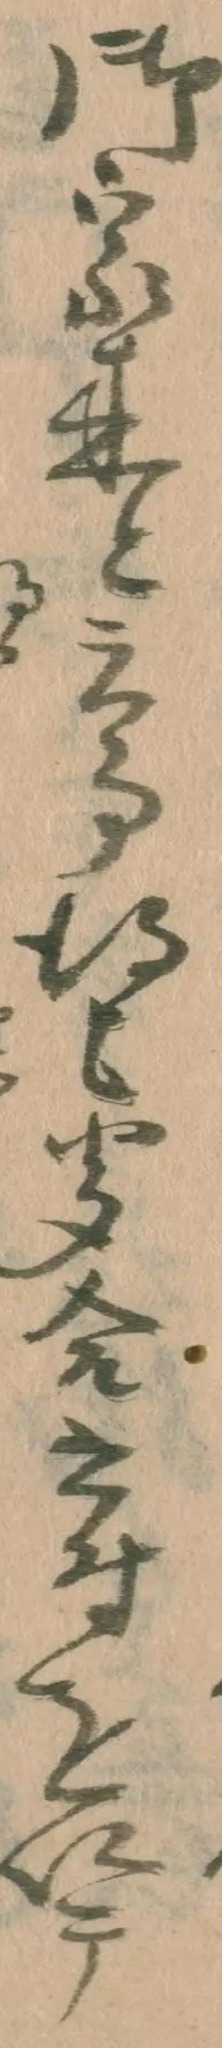御家来と云事得と聞合書付を以テ
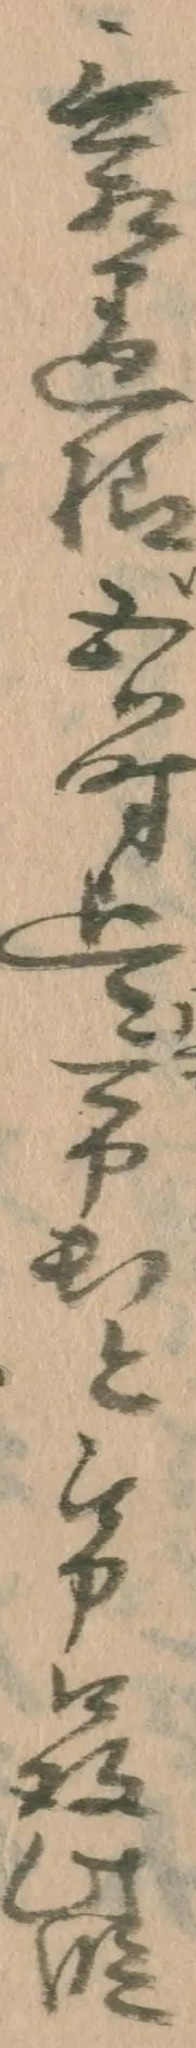無相違様明日五ツ時迄ニ御所へ可申出と被申候故此段
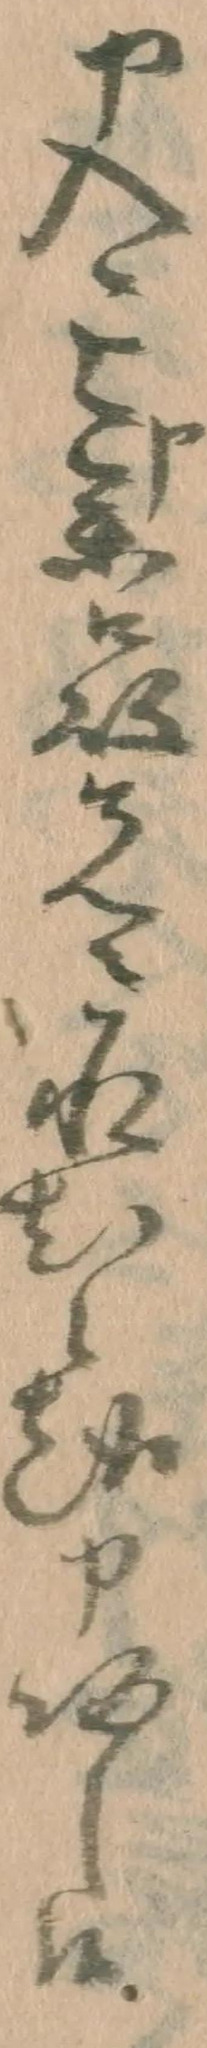申入候被申参候故先々承知之趣申帰し候
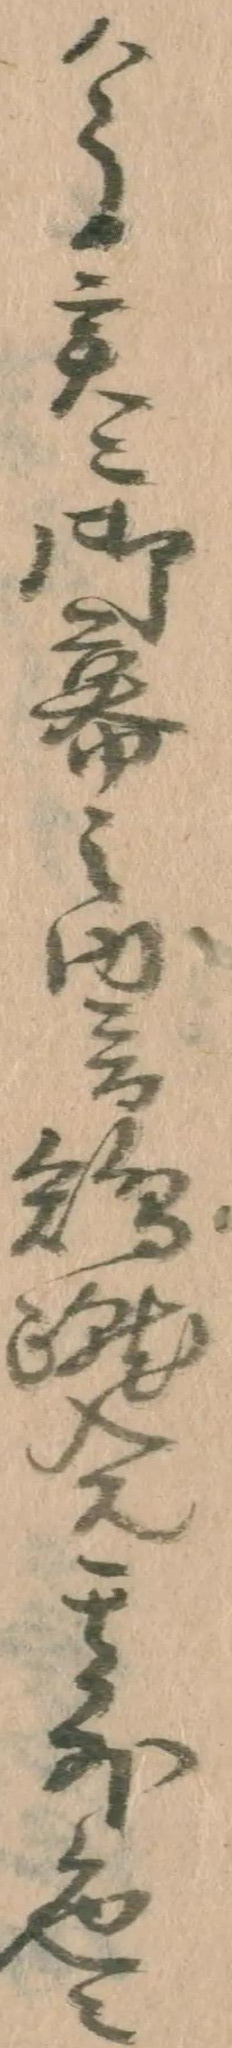今日実ニ御幕之内ニ而鶏蹴合其外色々
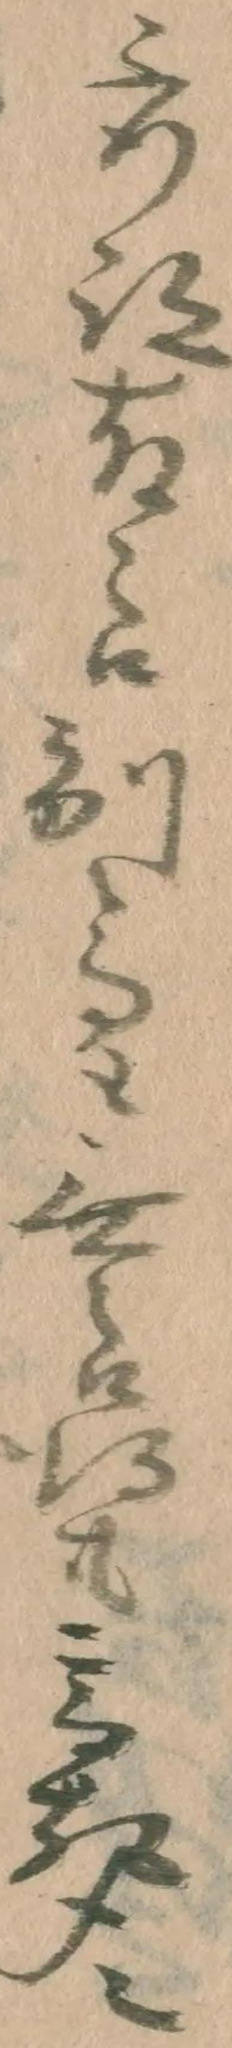不行跡有之候別之事も無之候得共高声ニ
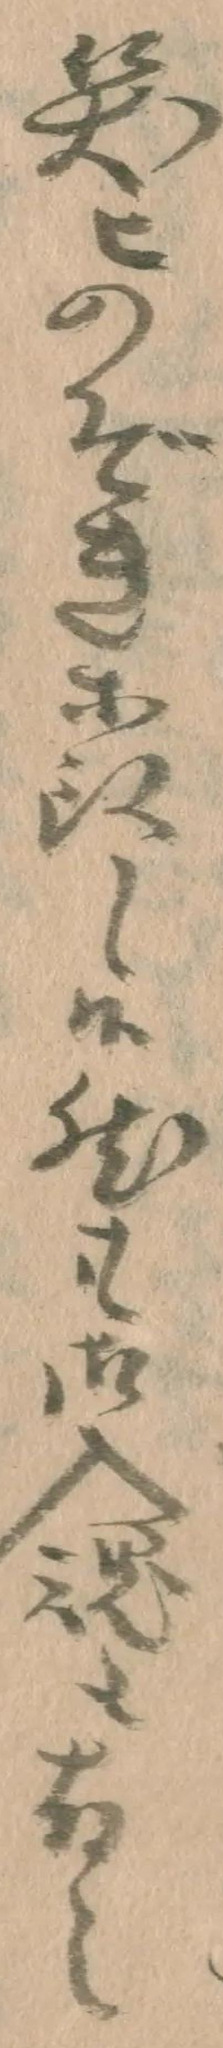笑ヒのぞき等致し候然共御入魂も有之
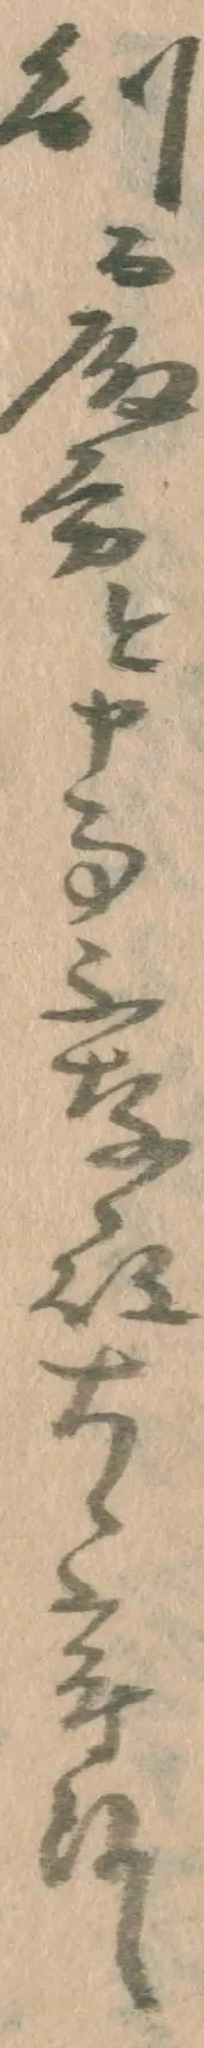別而殿方と申事不存候故右之書付致し
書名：賀茂社記録. 第61冊
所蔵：国立国会図書館 National Diet Library, JAPAN
